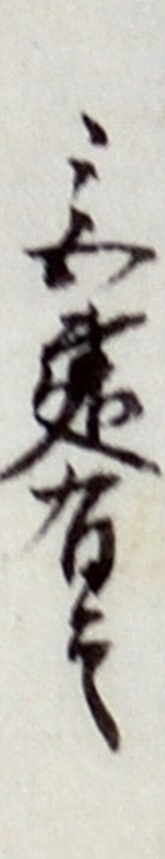宮建有之
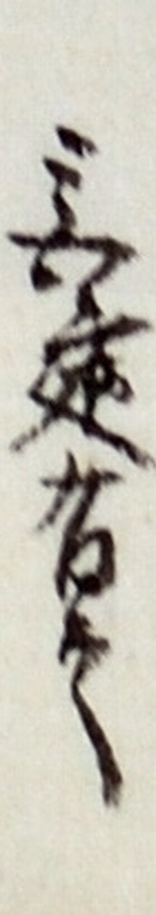宮建有之
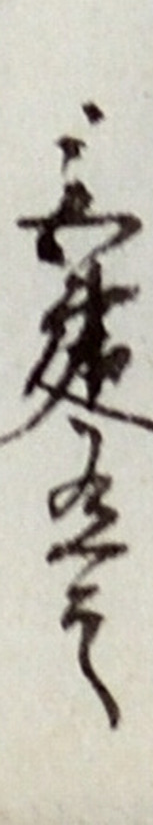宮建有之
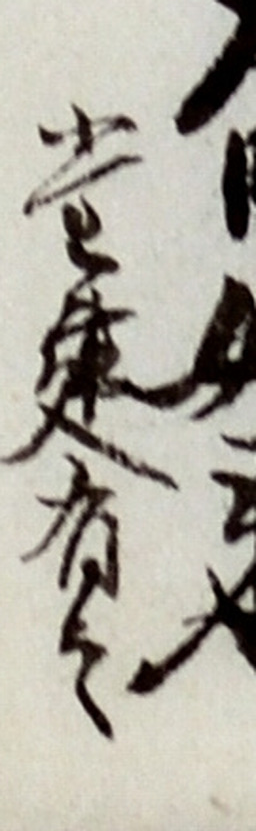堂建有之
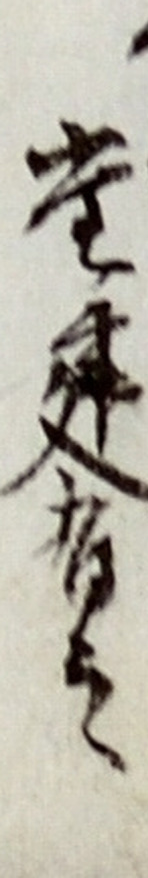堂建有之
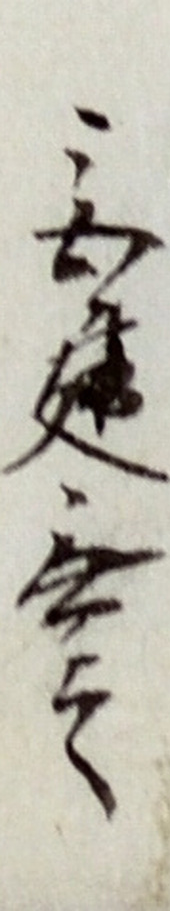宮建無之
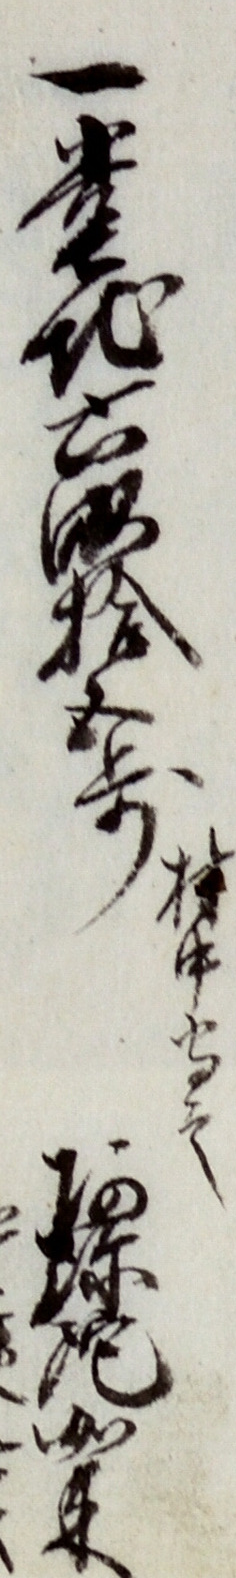一堂地六畝拾五歩阿弥陀如来
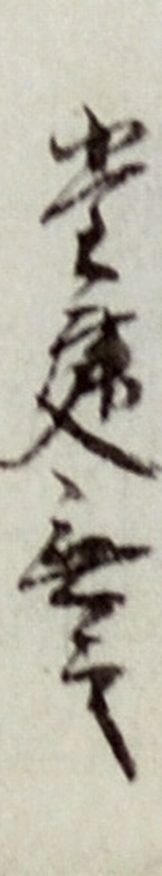堂建無之

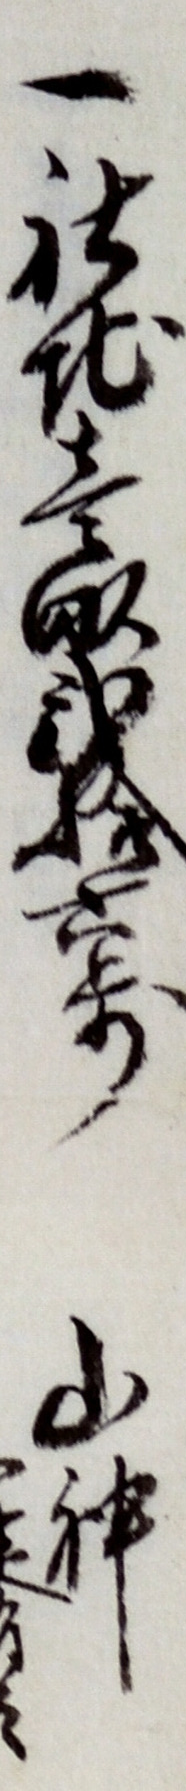一社地壱畝弐拾六歩山神
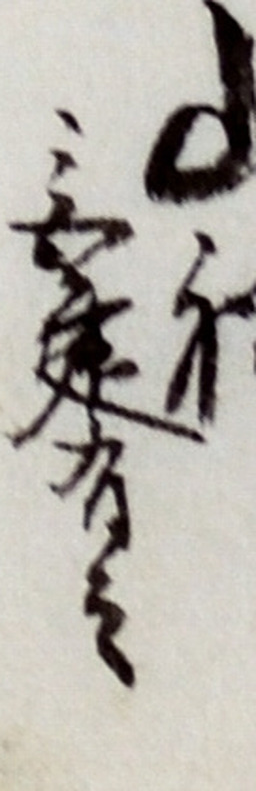宮建有之
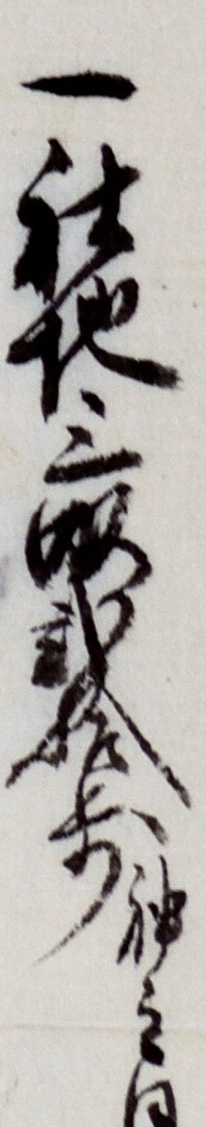一社地三畝弐拾歩山神
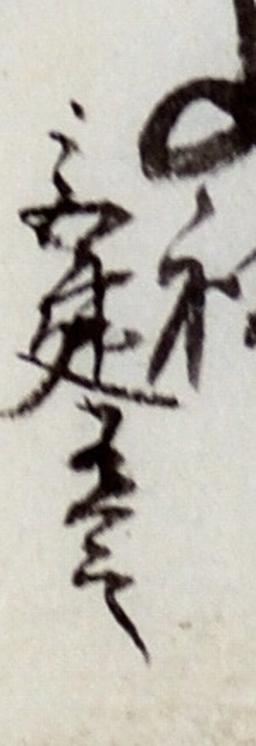宮建有之
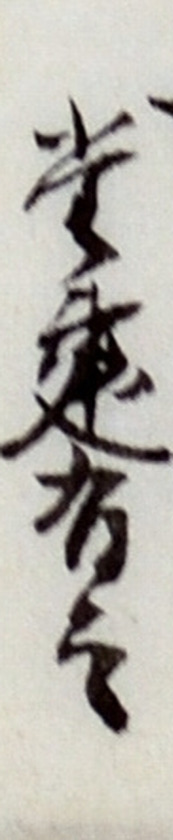宮建有之
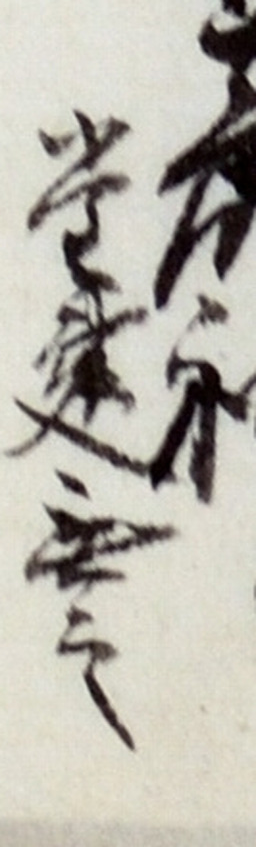堂建無之
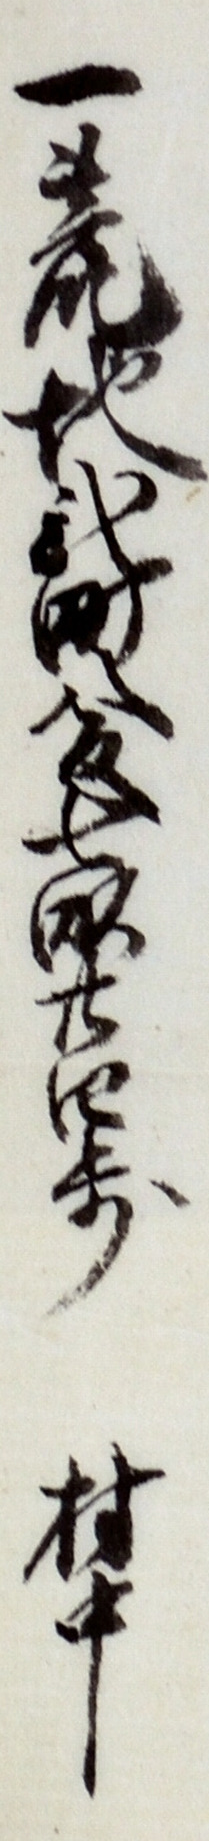一荒地弐町八反七畝廿四歩村中
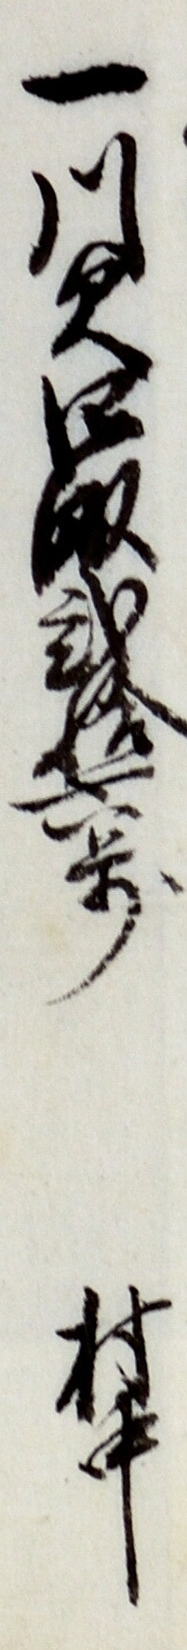一川欠四畝弐拾六歩村中
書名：御領分中山林社地手控
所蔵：伊那市立高遠町図書館・合同会社AMANE
